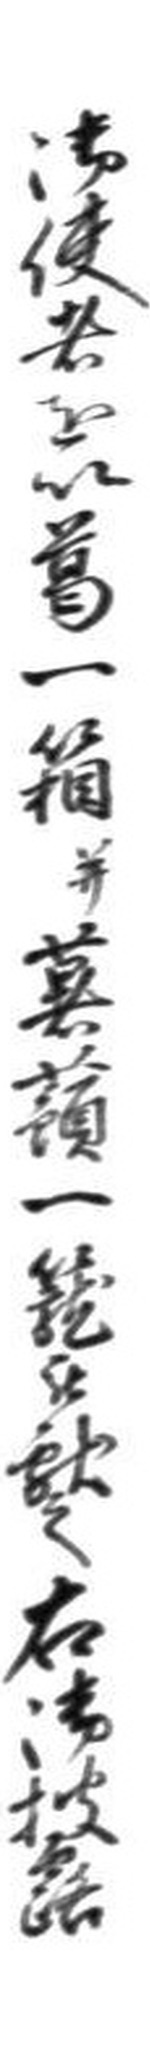御使者を以葛一箱并薯蕷一籠被献之右御披露
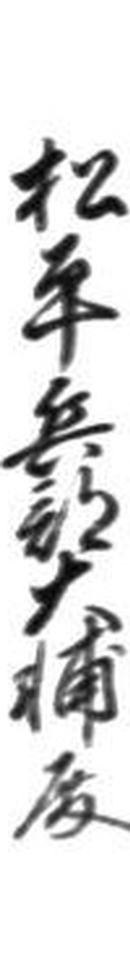松平兵部大輔殿

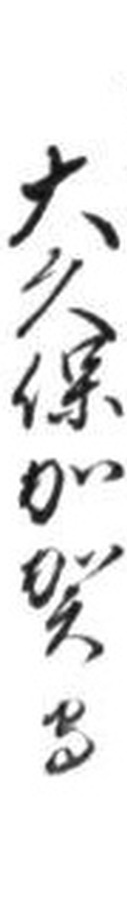大久保加賀守
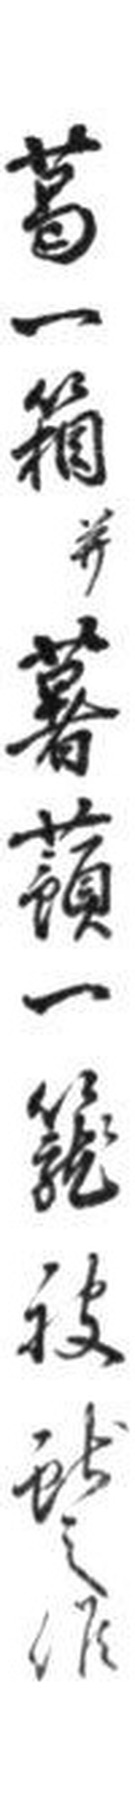葛一箱并薯蕷一籠被献之作
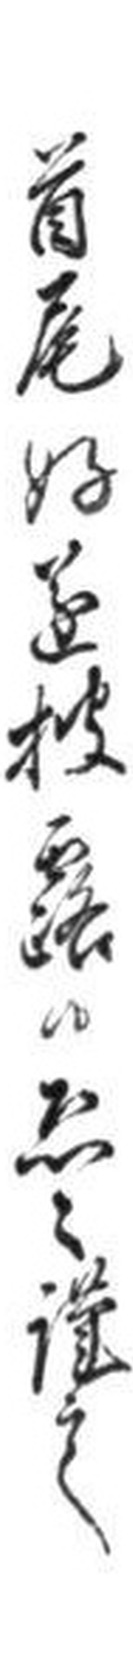首尾好遂披露候恐々謹言
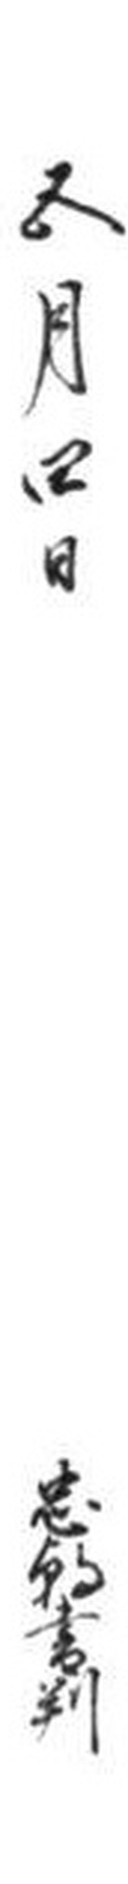五月四日忠朝書判
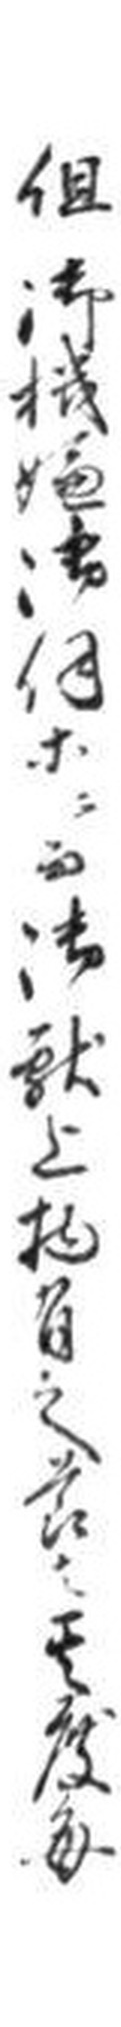但御機嫌御伺等ニ而御献上物有之節者其度毎
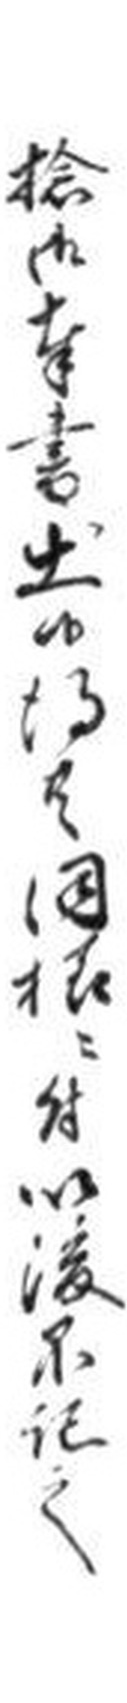捻御奉書出候得共同様ニ付以後不記之
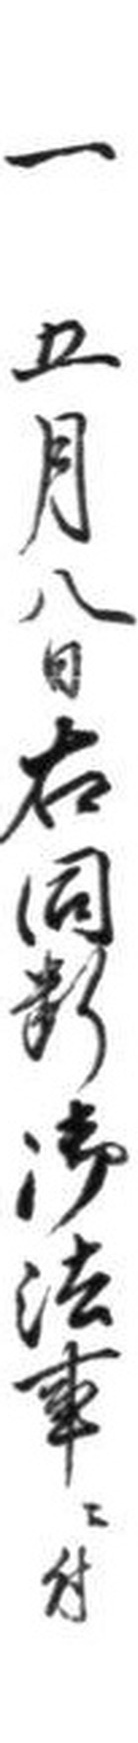一五月八日右同断御法事ニ付
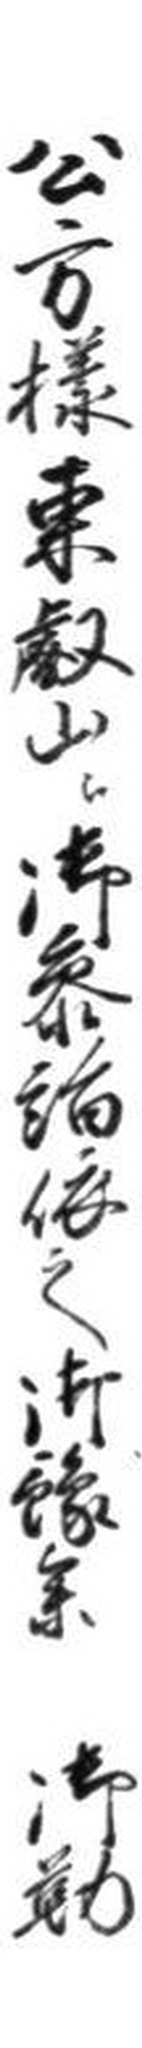公方様東叡山江御参詣依之御豫参御勤
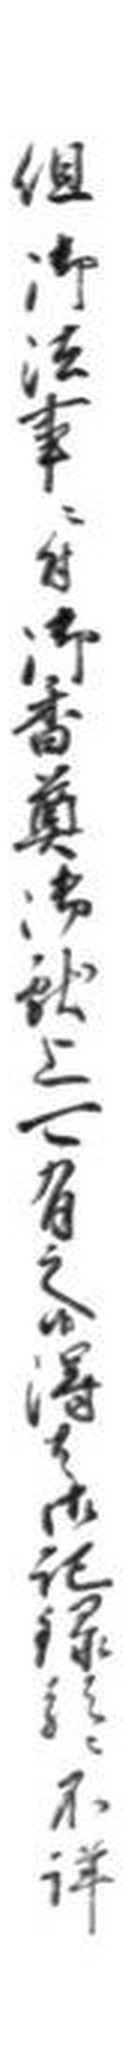但御法事ニ付御香奠御献上可有之候得共御記録類ニ不詳
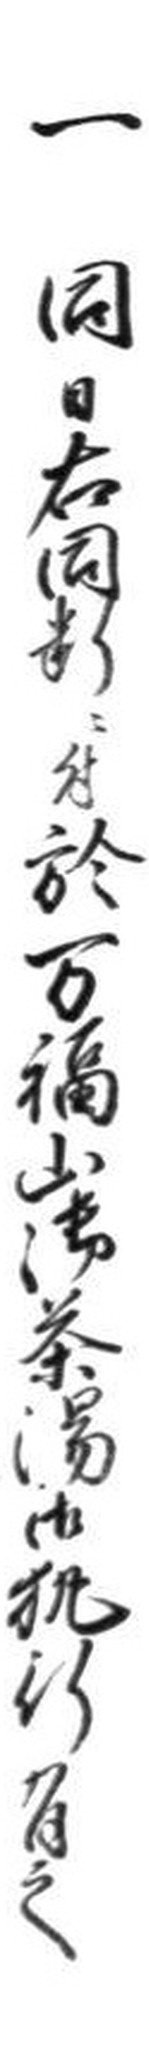一同日右同断ニ付於万福山御茶湯御執行有之
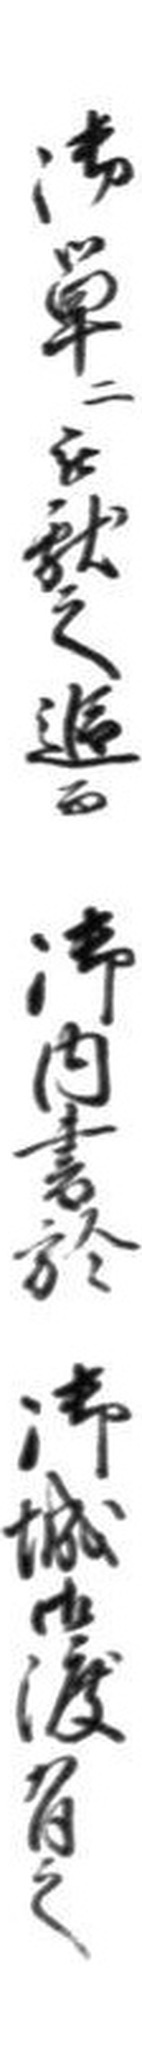御単ニ被献之追而御内書於御城御渡有之
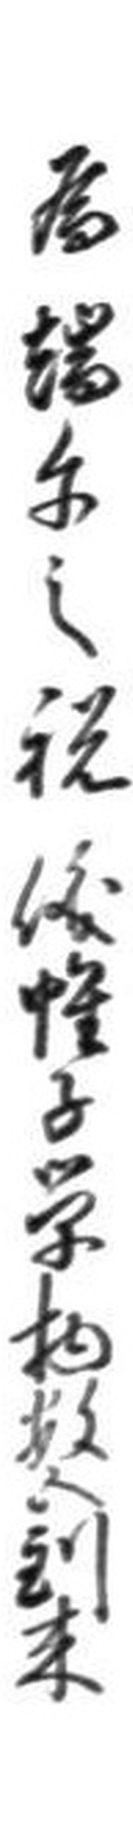為端午之祝儀帷子単物数五到来
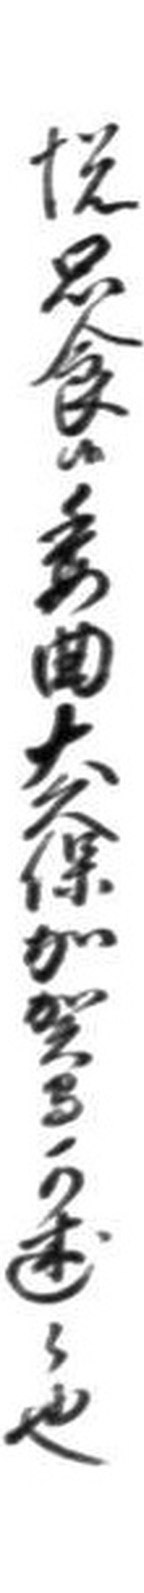悦思食候委曲大久保加賀守可述候也
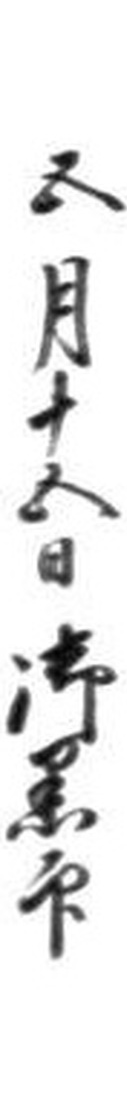五月十八日御黒印
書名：家譜 十六 吉品公 従貞享三年閏三月到同四年
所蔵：福井県文書館 Fukui Prefectural Archives
